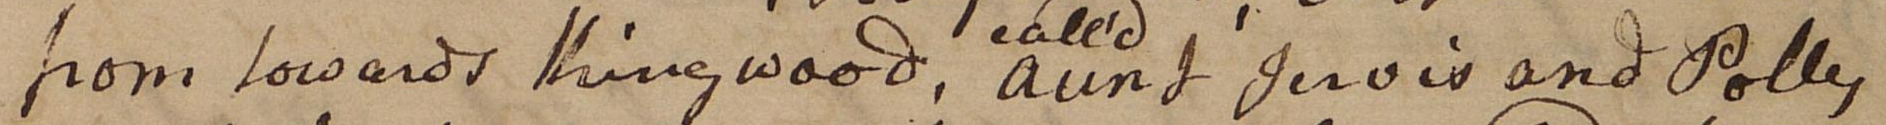from towards Kingwood, ^ Aunt Jervis and Polly
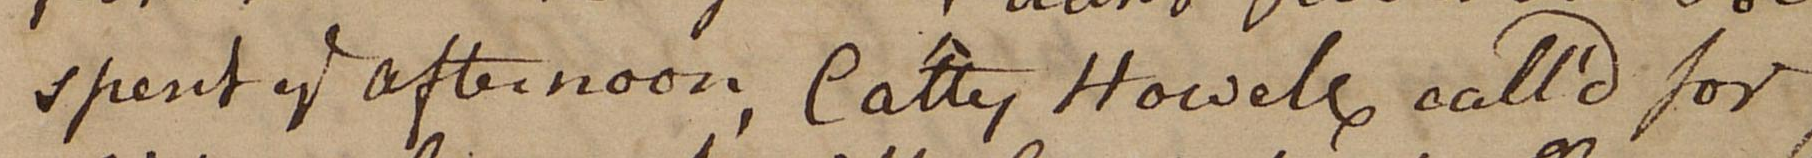spent y^e afternoon, Catty Howell call'd for
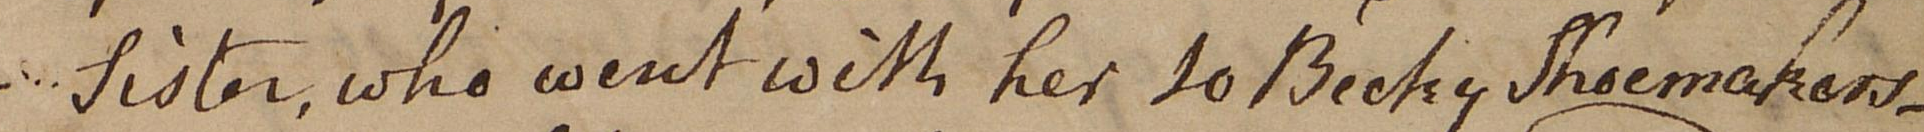Sister, who went with her to Becky Shoemakers
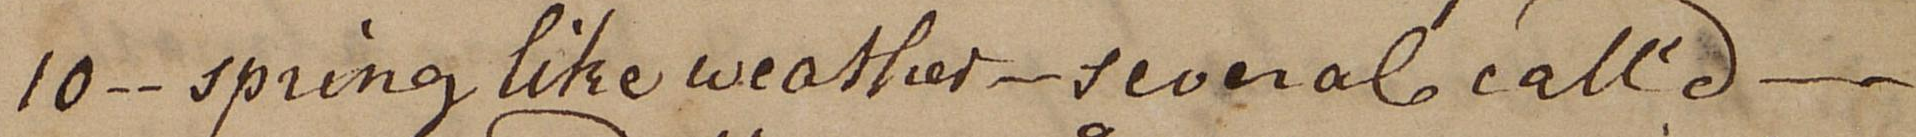10-- spring like weather- several call'd-
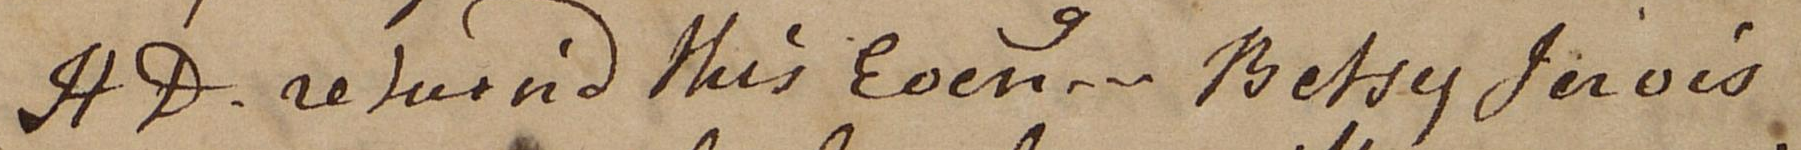HD. return'd this Even^g-- Betsy Jervis
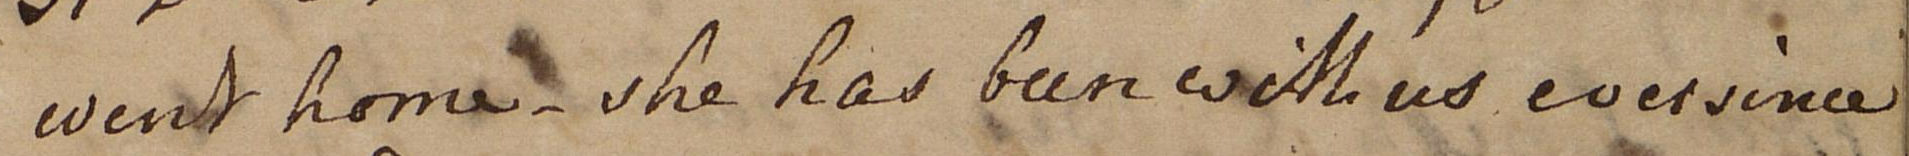went home- she has been with us ever since
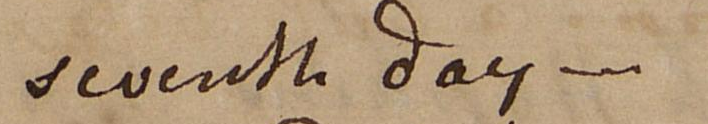seventh day-
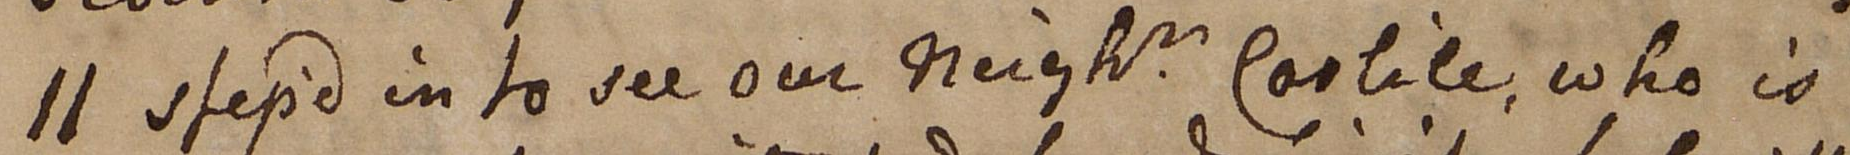11 step'd in to see our Neigh^r. Carlile, who is
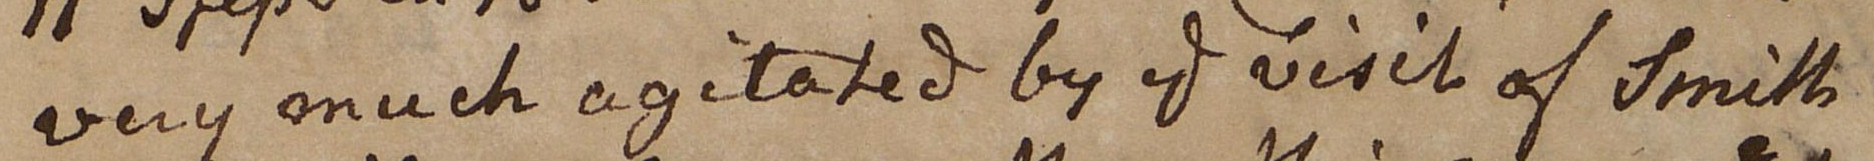very much agitated by y^e visit of Smith
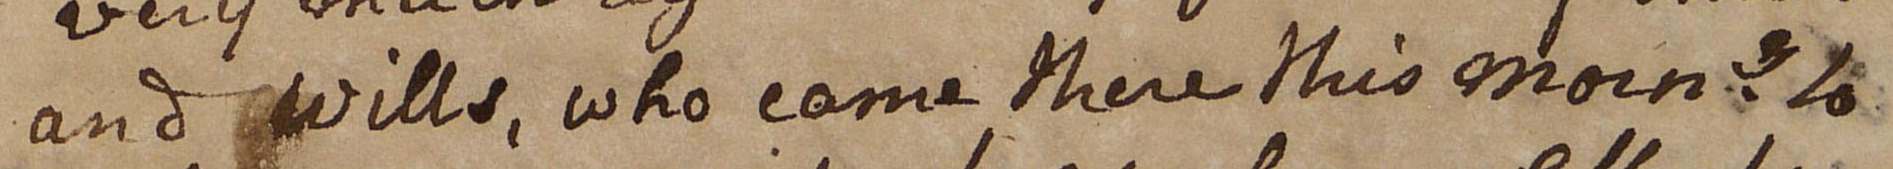and Wills, who came there this morn^g. to
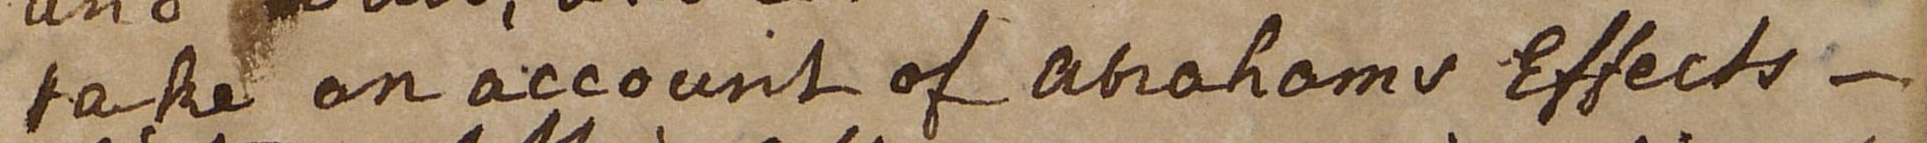take an account of Abrahams Effects-
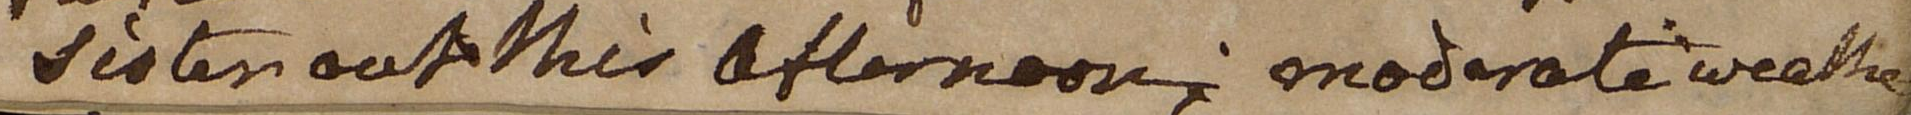sister out this afternoon; moderate weathe
